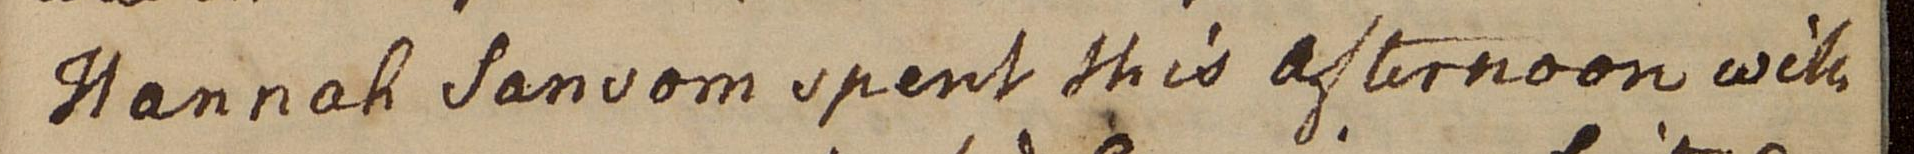Hannah Sansom spent this Afternoon with
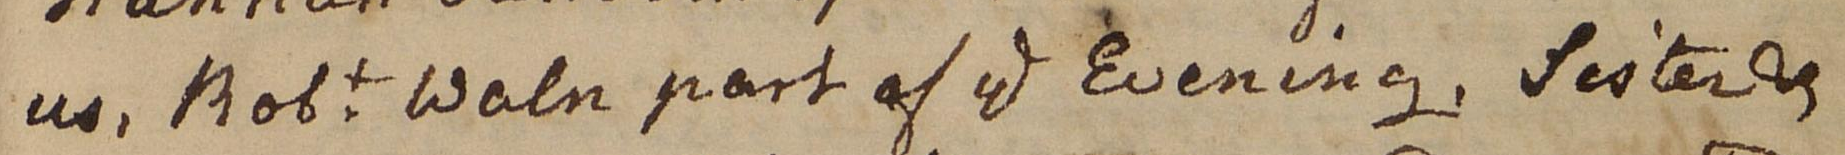us, Rob^t. Waln part of y^e Evening, Sister &
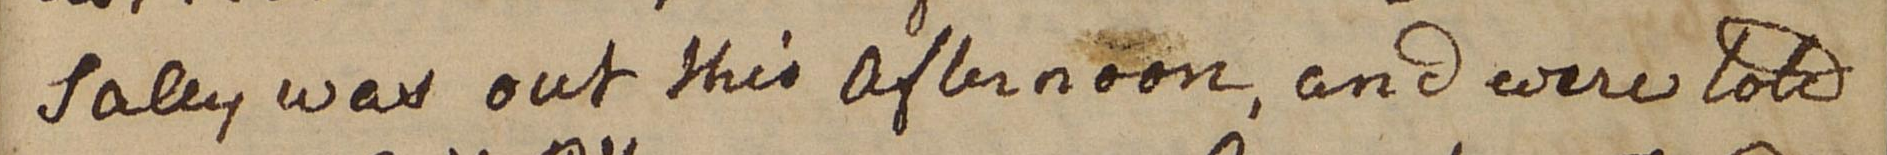Sally was out this Afternoon, and were late
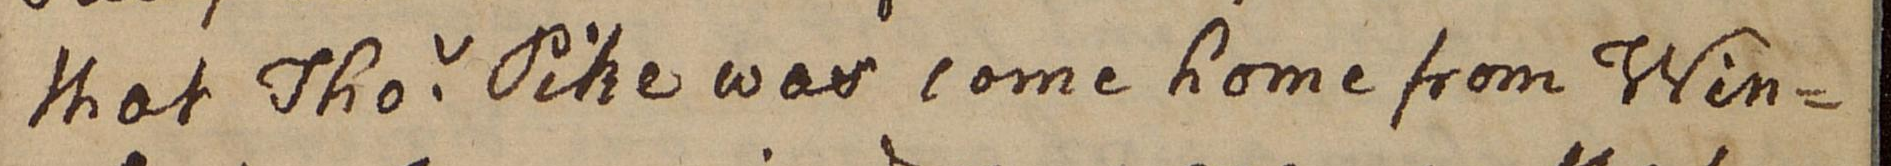that Tho^s. Pike was come home from Win-
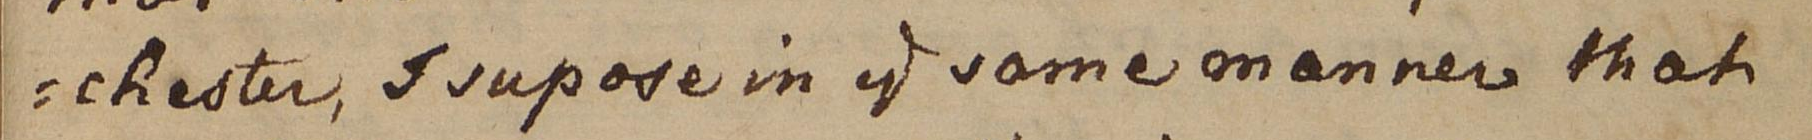-chester, I supose in y^e same manner that
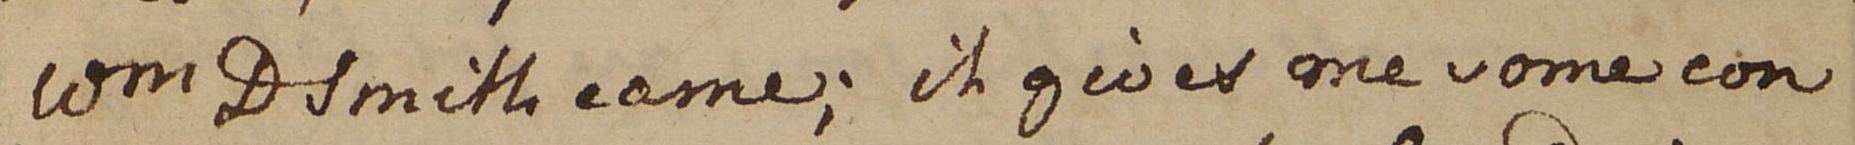W^m D Smith came; it gives me some con
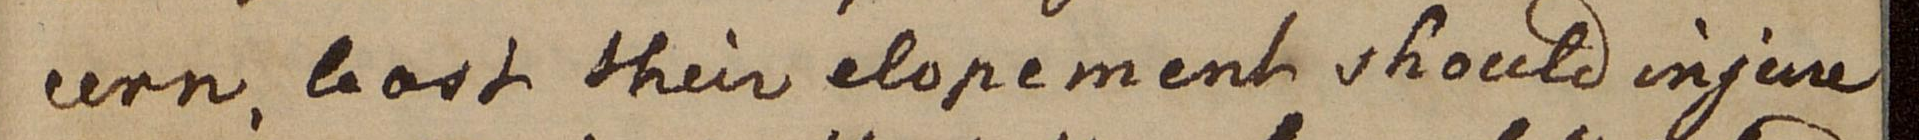cern, least their elopement should injure
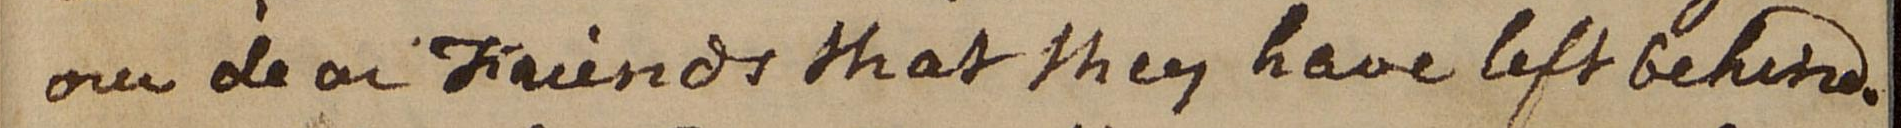our dear Friends that they have left behind.
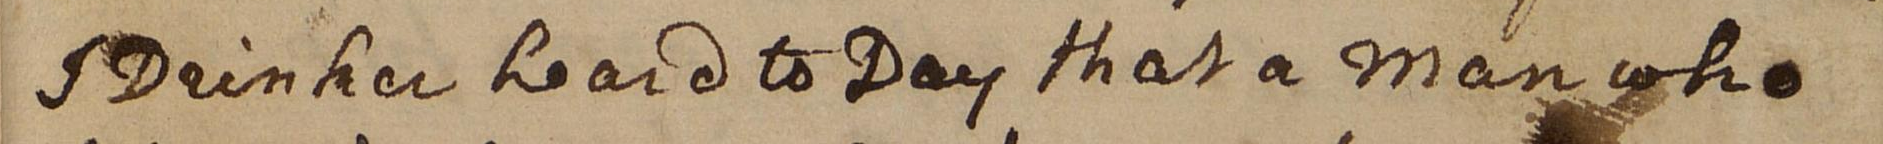I Drinker heard to Day that a man who
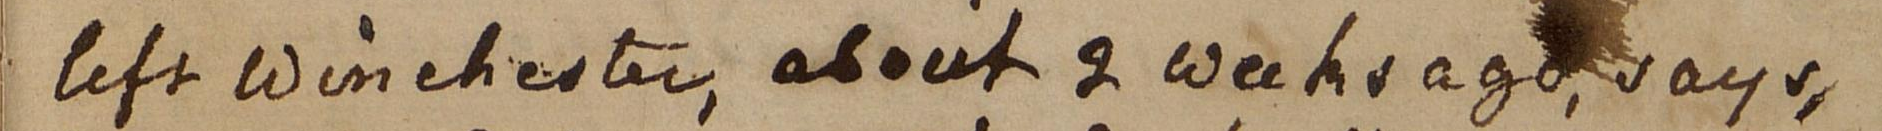left Winchester, about 2 weeks ago, says,
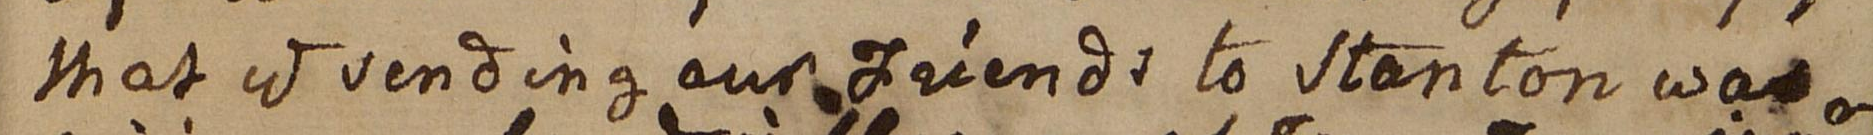that y^e sending our Friends to Stanton was
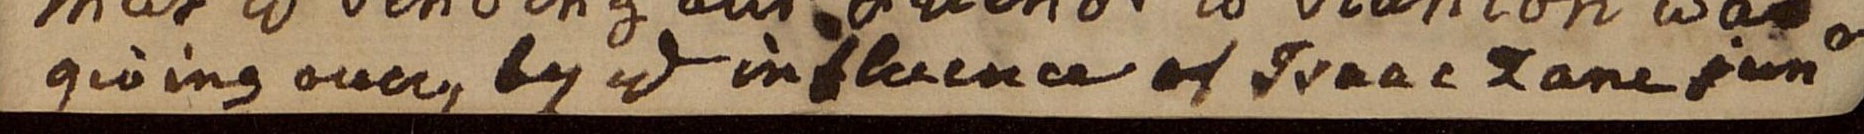giving over, by y^e influence of Isaac Zane jun^r
